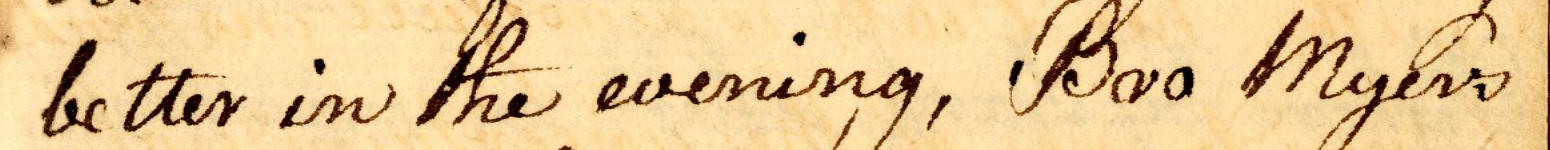better in the evening, Bro Myers
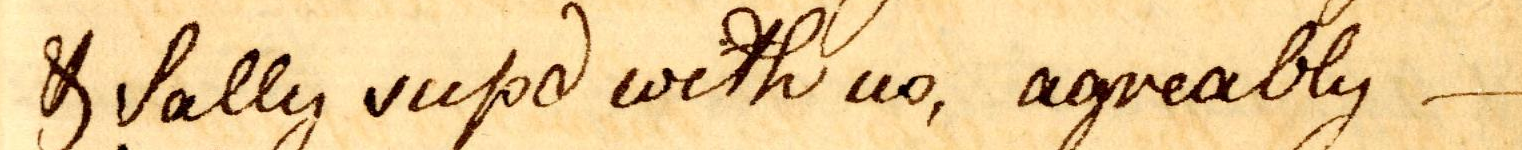& Sally supd with us, agreably
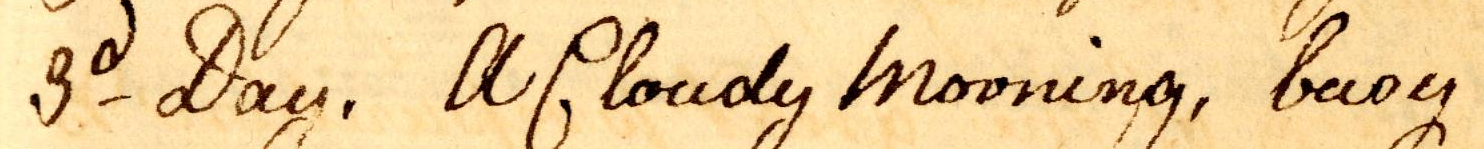3^d Day. A Cloudy morning, busy
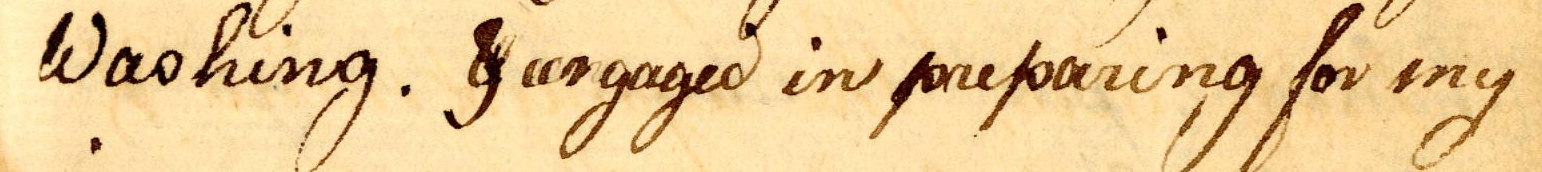Washing. & engaged in preparing for my
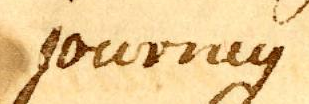journey
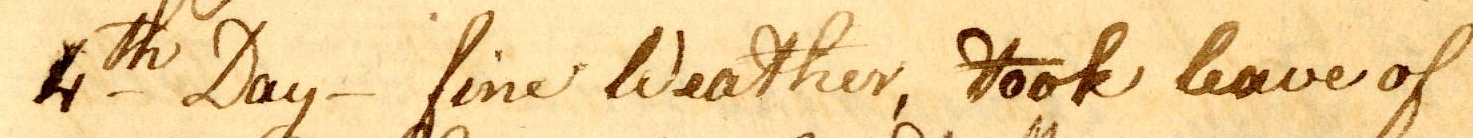4^th Day- fine Weather, took leave of
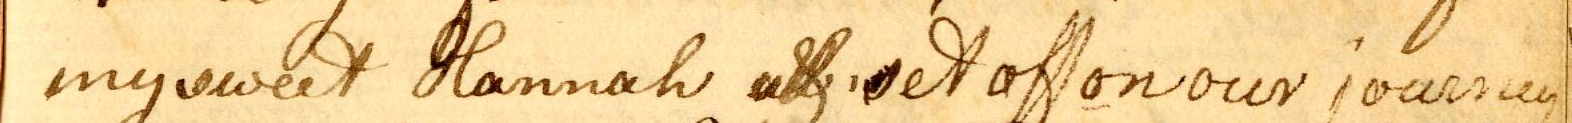my sweet Hannah & set off on our journey
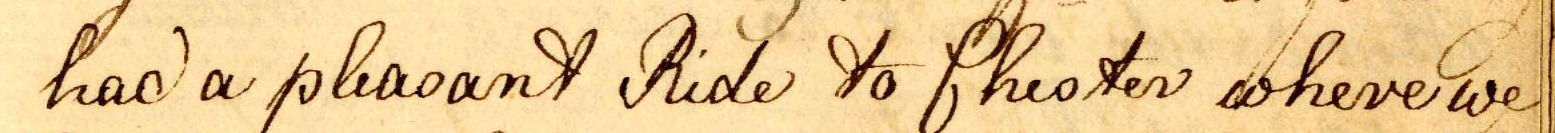had a pleasant Ride to Chester where we
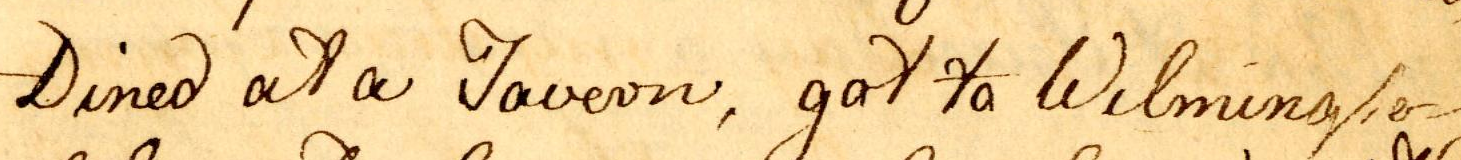Dined at a Tavern, got to Wilmington
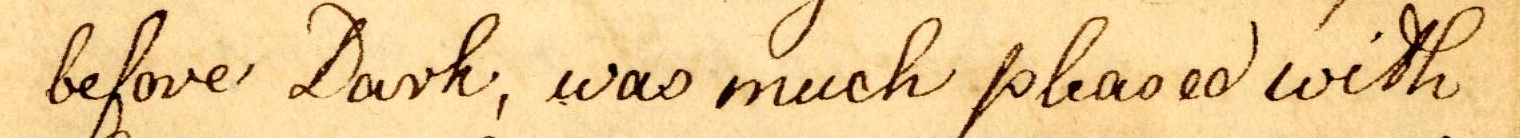before Dark, was much pleased with
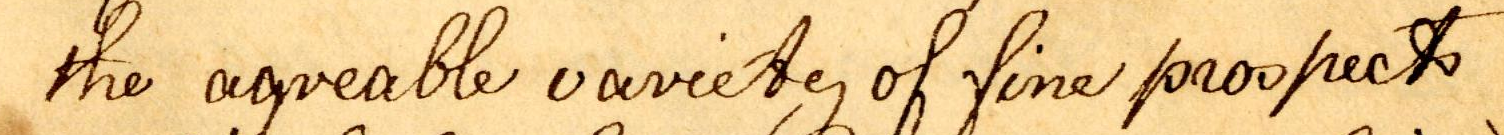the agreable variety of fine prospects
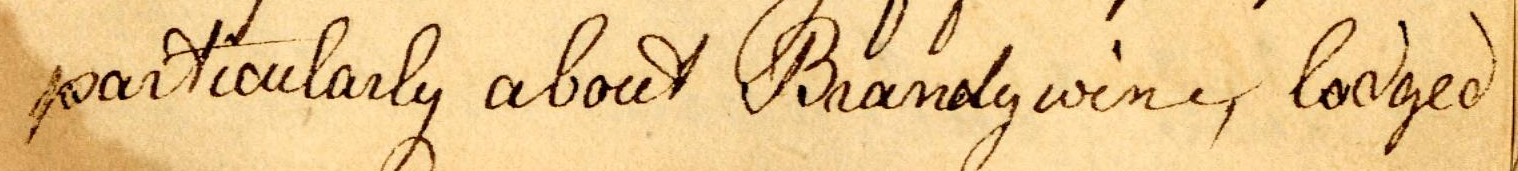particularly about Brandywine, lodged
